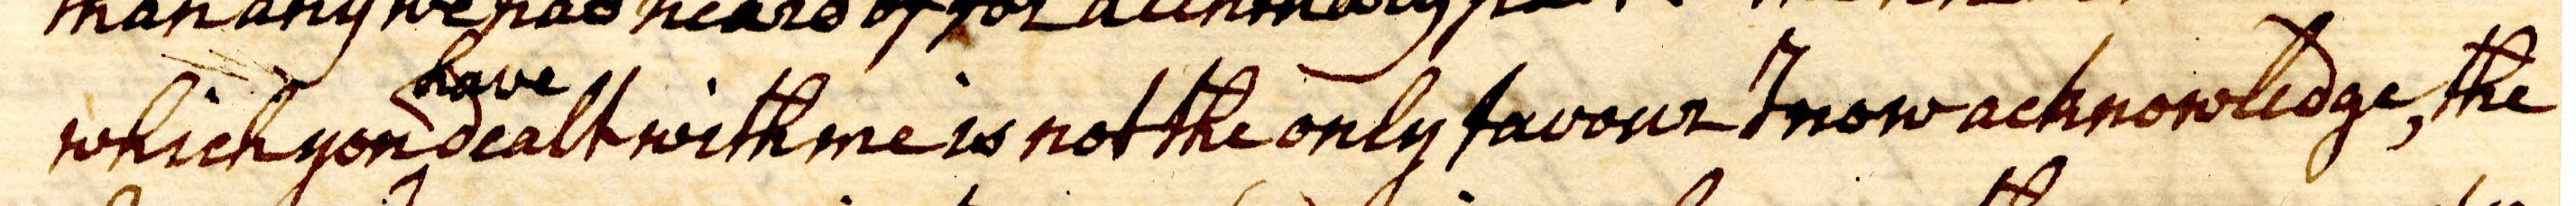which you ^ dealt with me is not the only favour I now acknowledge, the
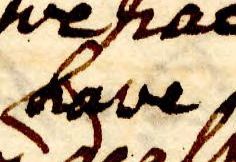have
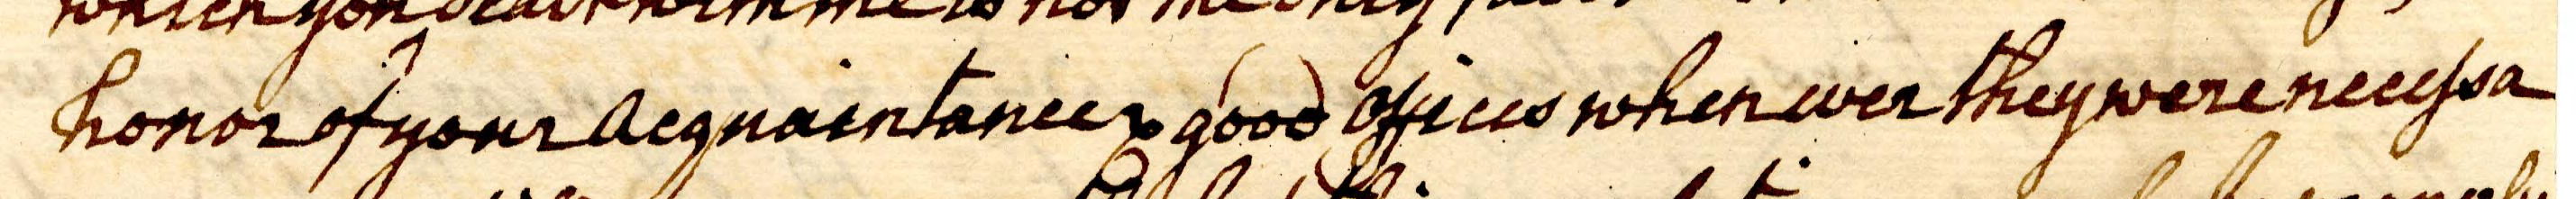honor of your Acquaintance & good offices when ever they were necessa-
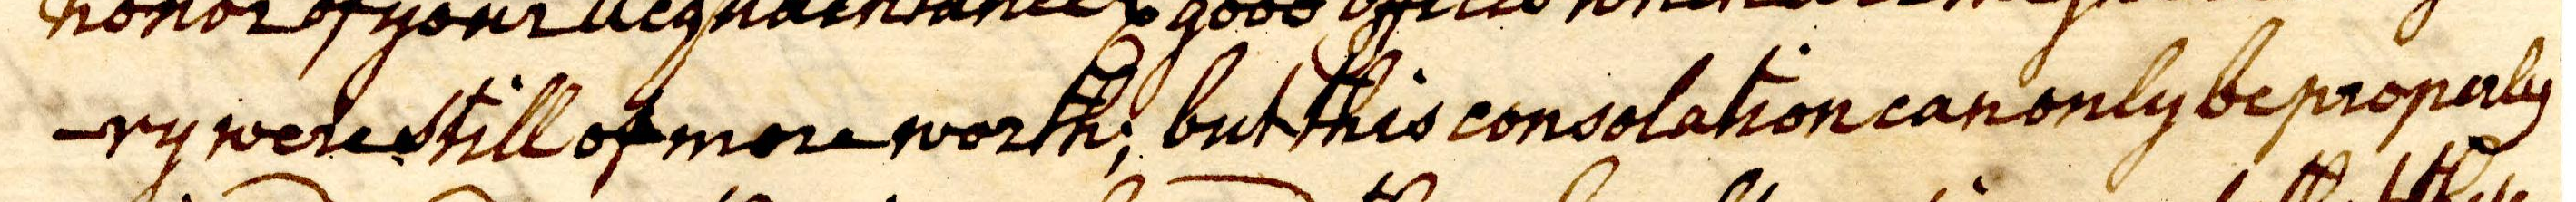-ry were still of more worth; but this consolation can only be properly
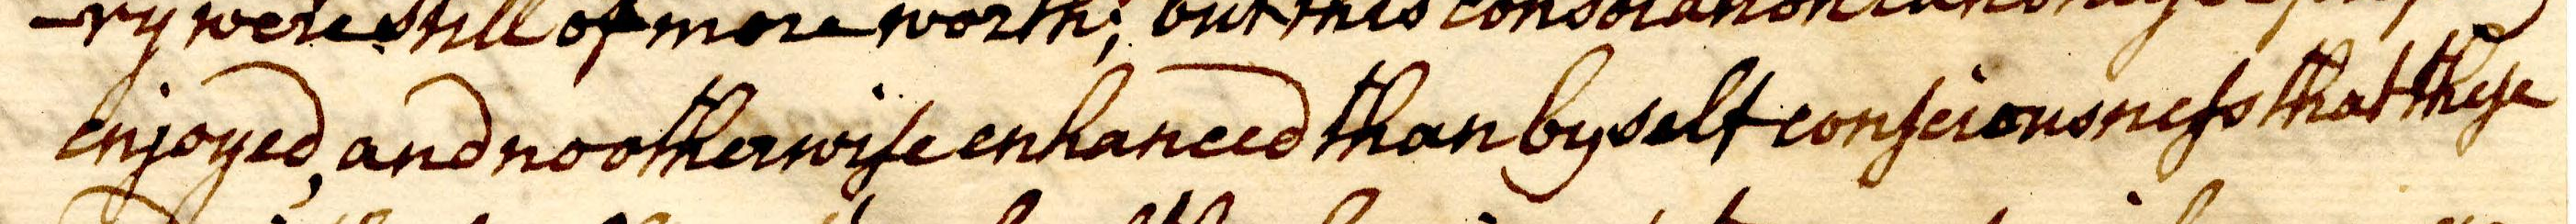enjoyed, and no otherwise enhanced than by self consciousness that these
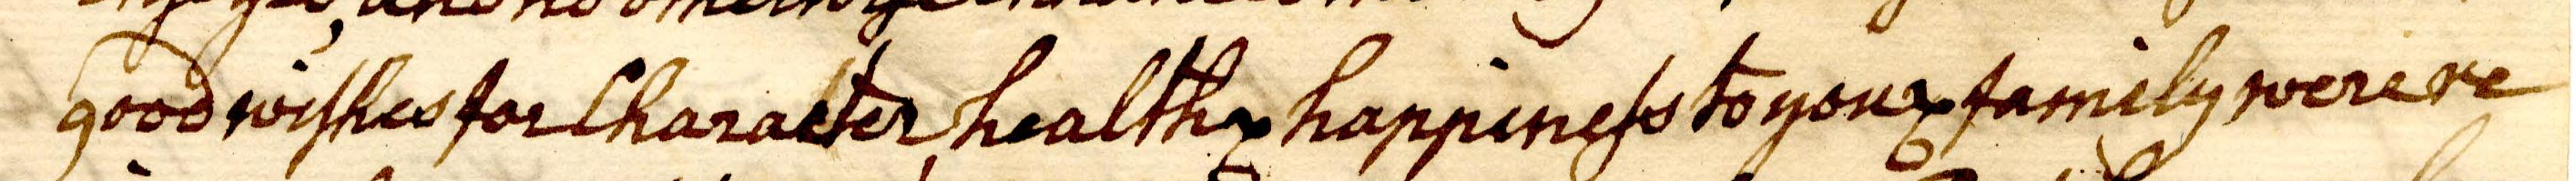good wishes for Character, health & happiness to you family were re
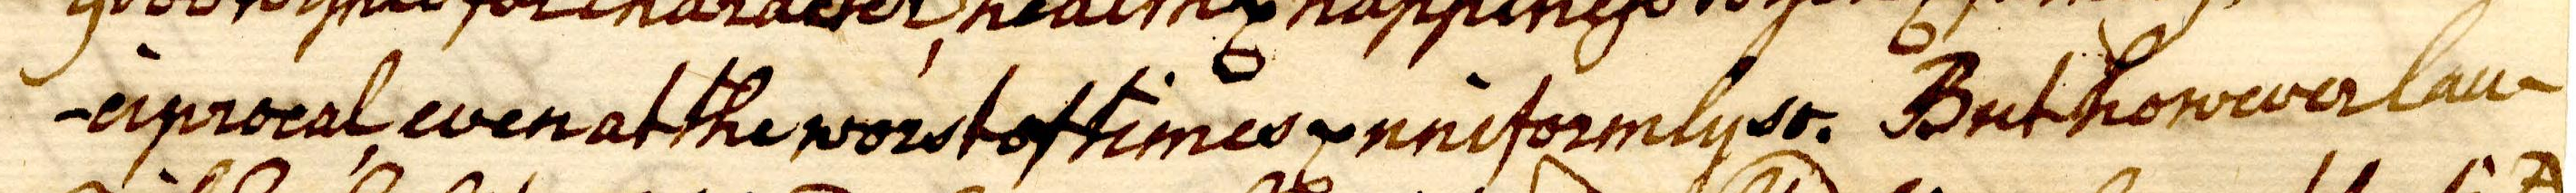-ciprocal, even at the worst of times & uniformly so. But however lau-
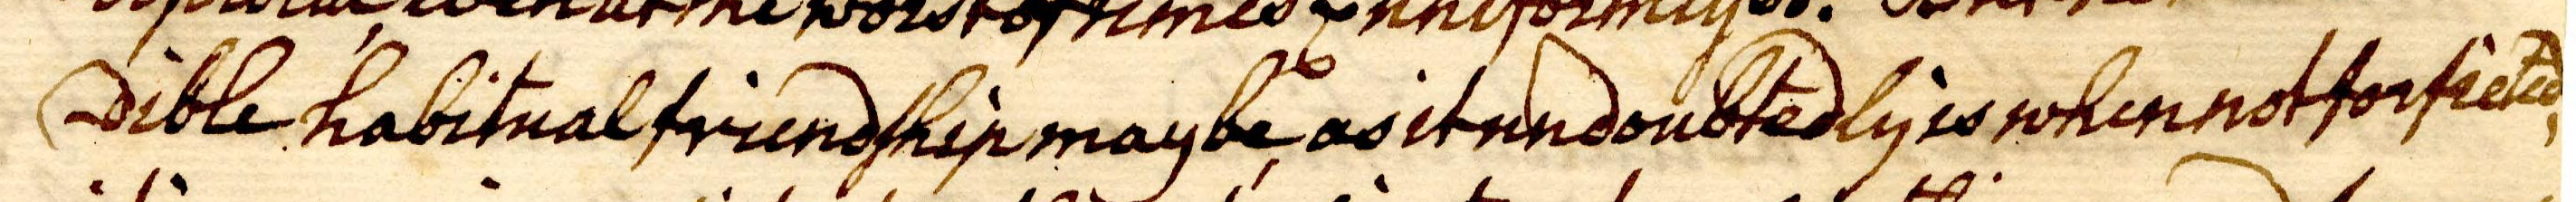-dible habitual friendship may be, as it undoubtedly is when not forfieted,
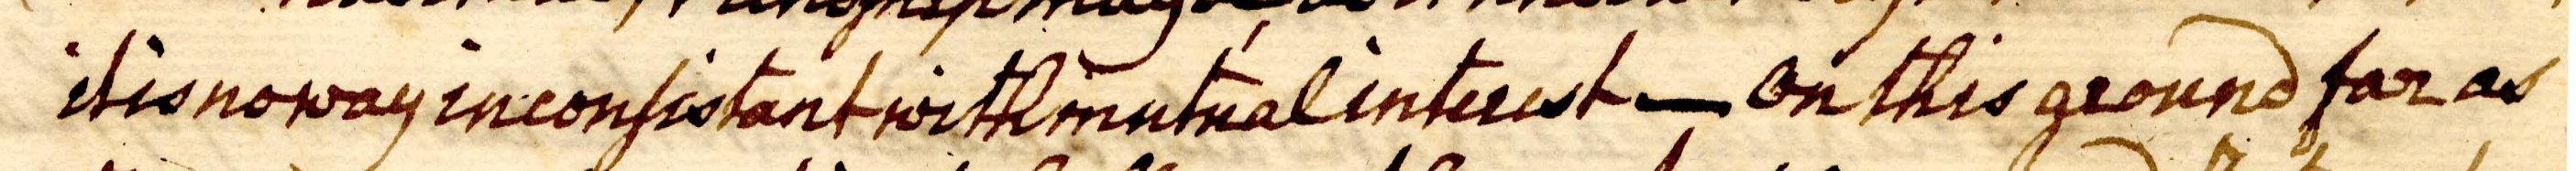it is no way inconsistant with mutual interest- On this ground far as
